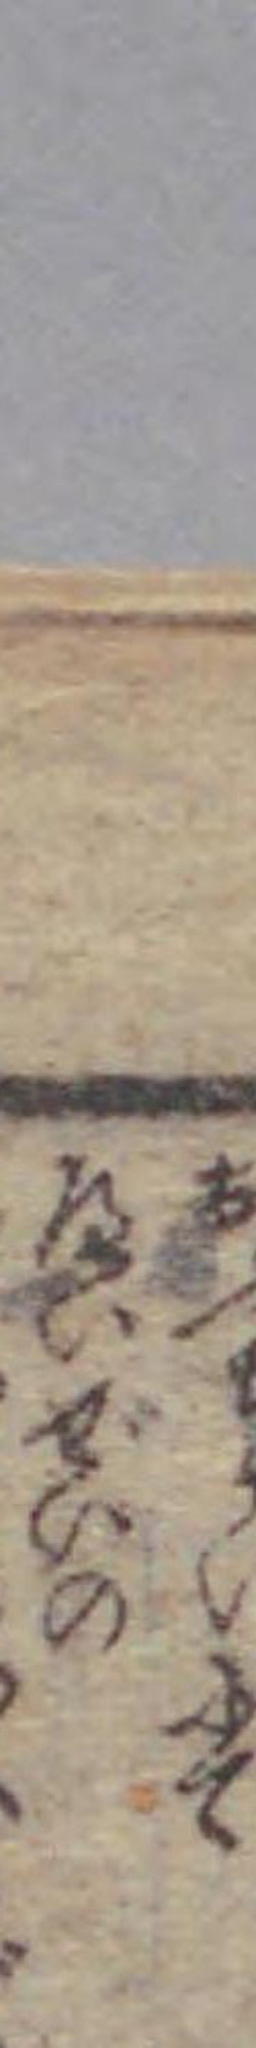へいぜいの
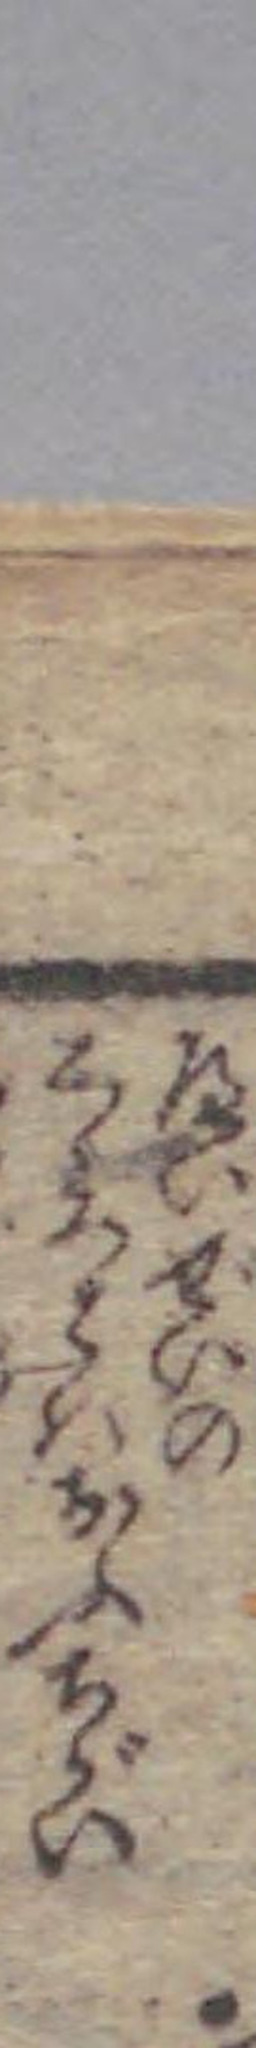こゝろとはおふちがい
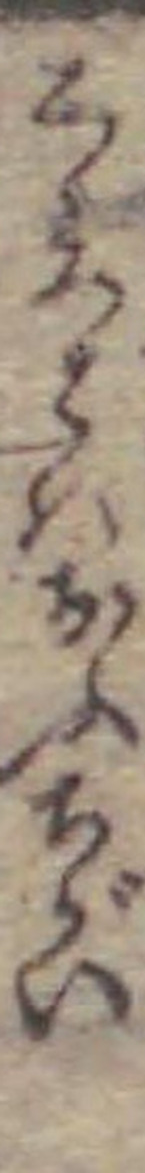こゝろとはおふちがい
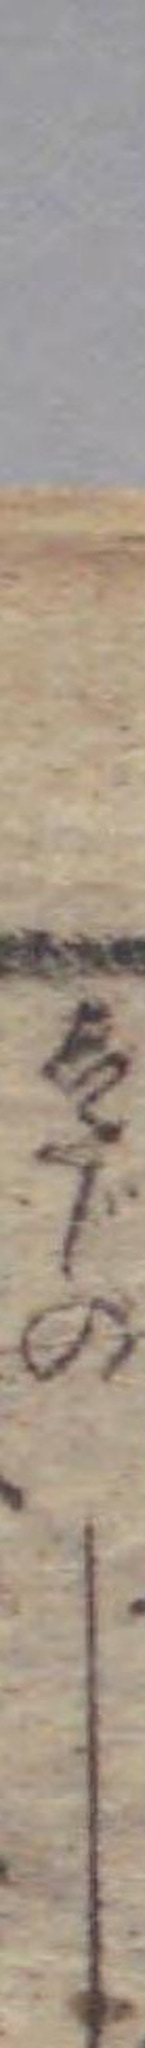したじの
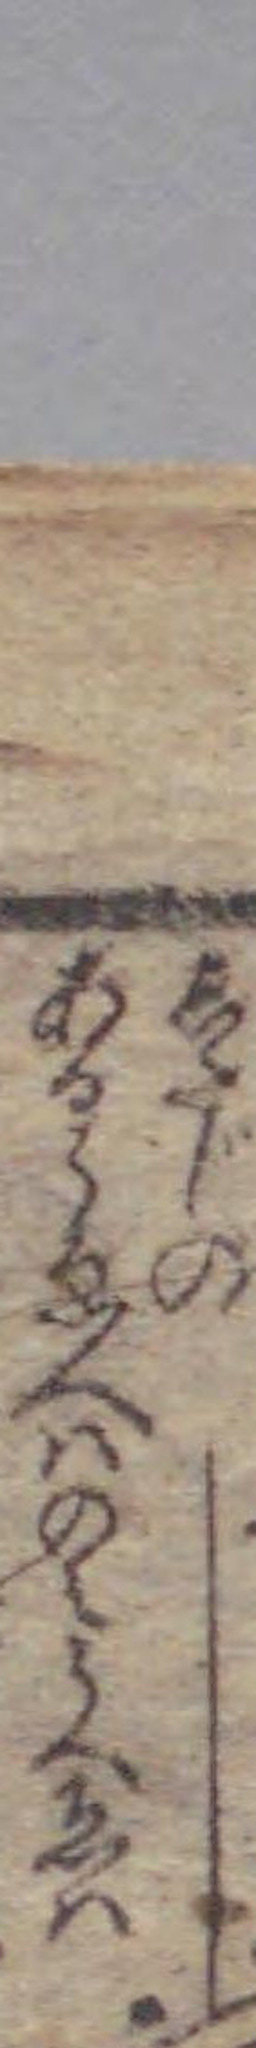あるうゑへはのみうへゑは
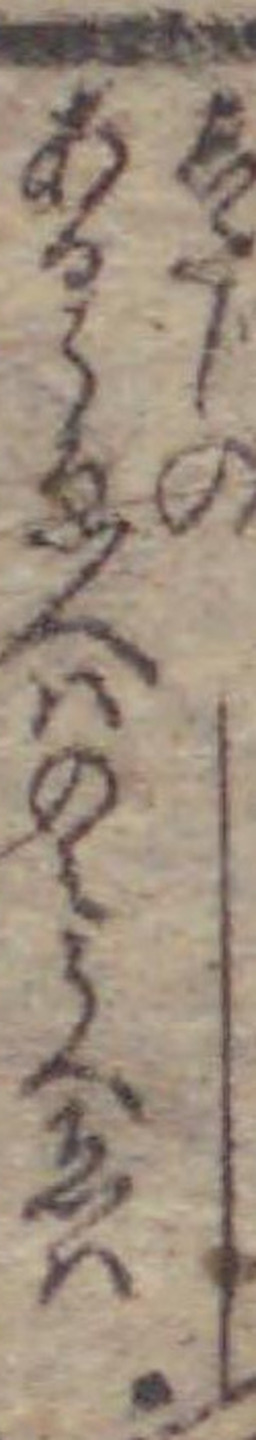あるうゑへはのみうへゑは
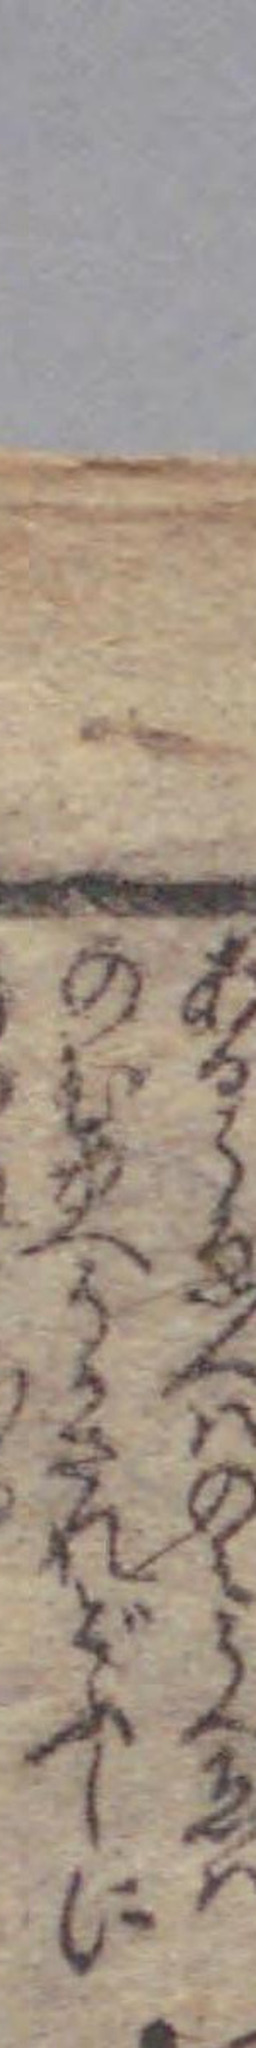のむゆへうかされどふしに
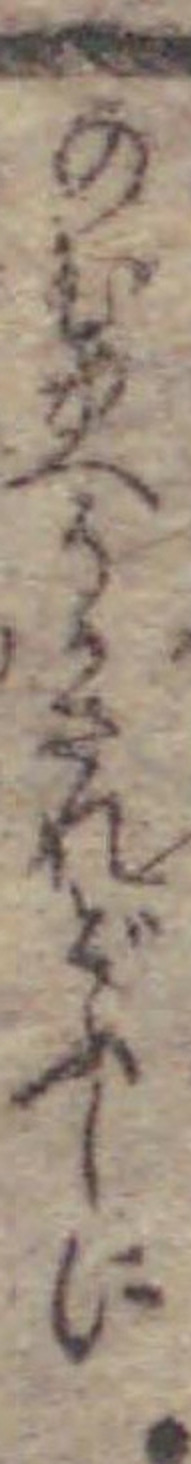のむゆへうかされどふしに

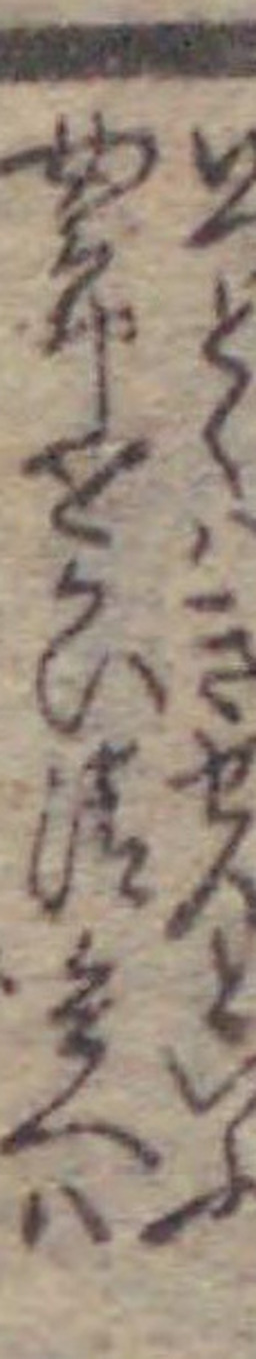女郎をかひ清兵へは
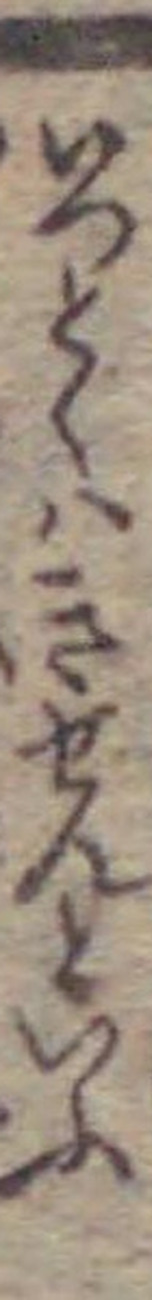いつとくはきせんといふ
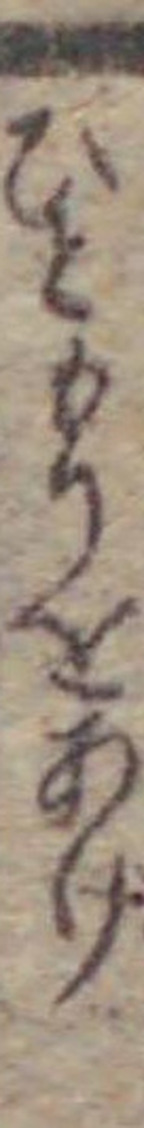ひともりをあげ
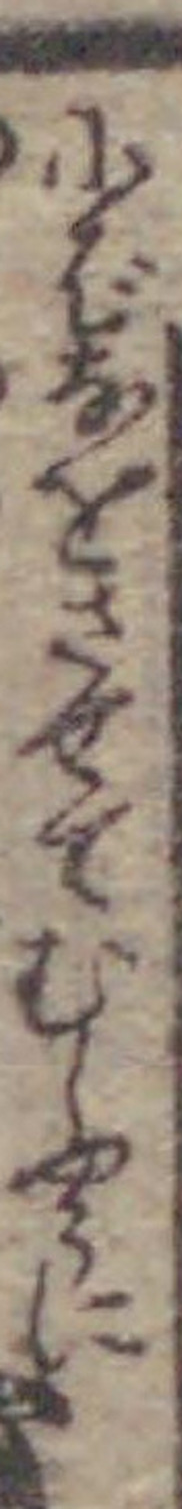にばなをさせてむしやうに
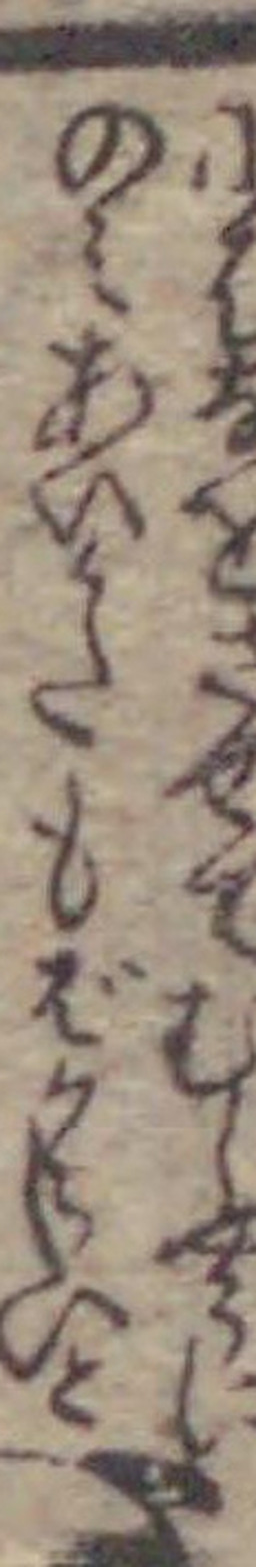のみあいかたもばからしいと
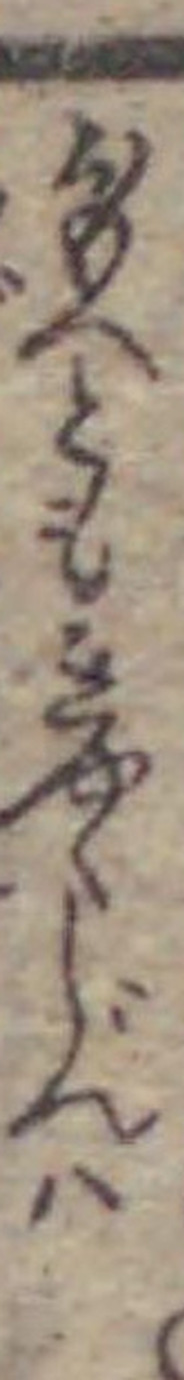おもへともきやくじんは
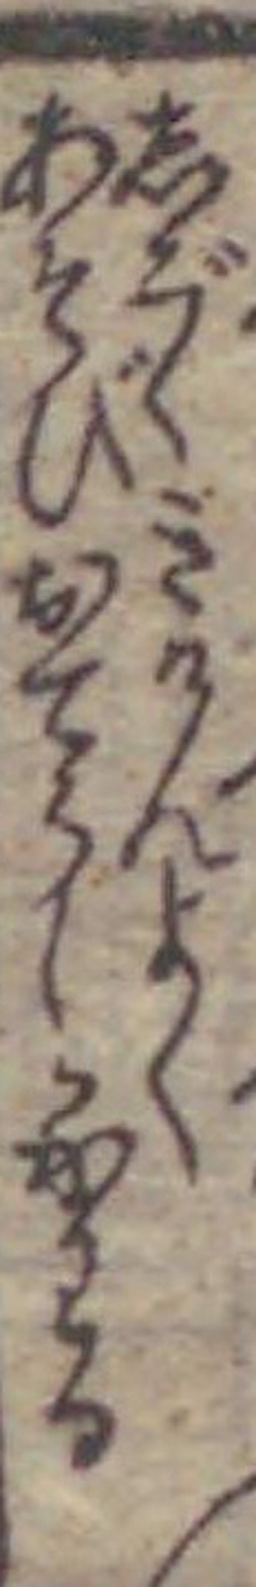あそびおてうしかかわる
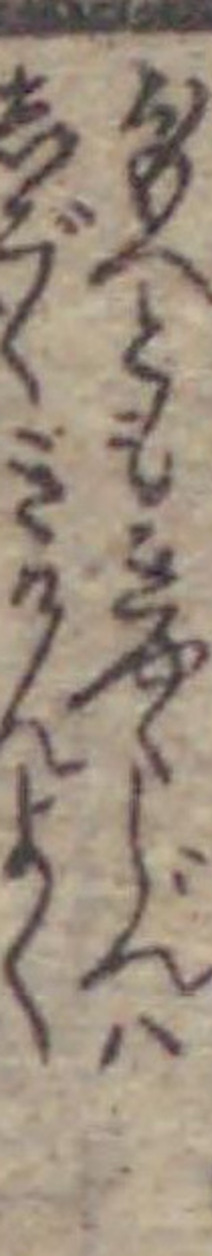しごくきけんよく
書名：見通占 : 3巻
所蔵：国立国会図書館 National Diet Library, JAPAN
